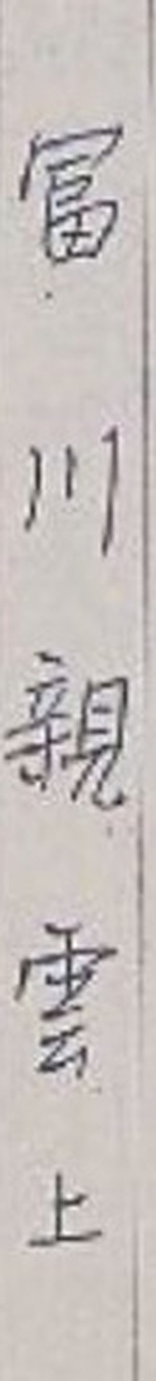古堅親雲上
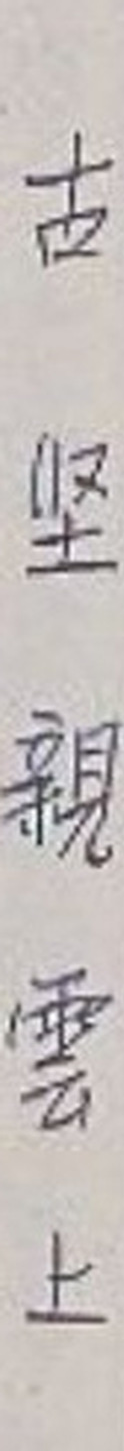古堅親雲上
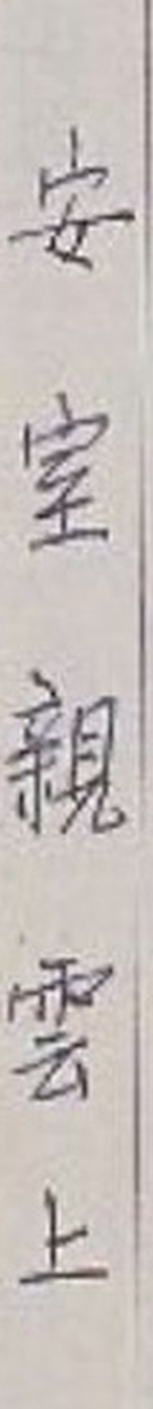安室親雲上
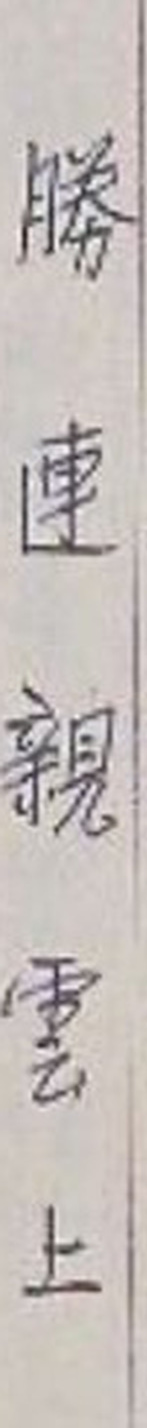勝連親雲上
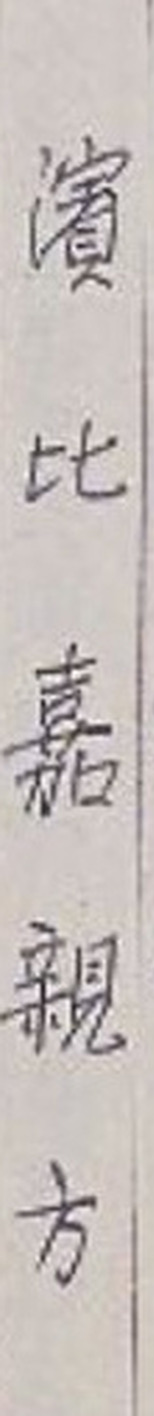浜比嘉親方
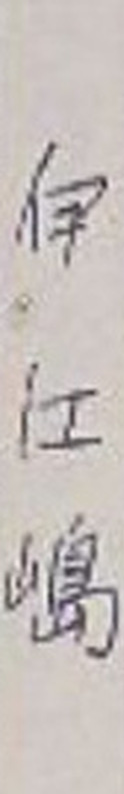伊江島
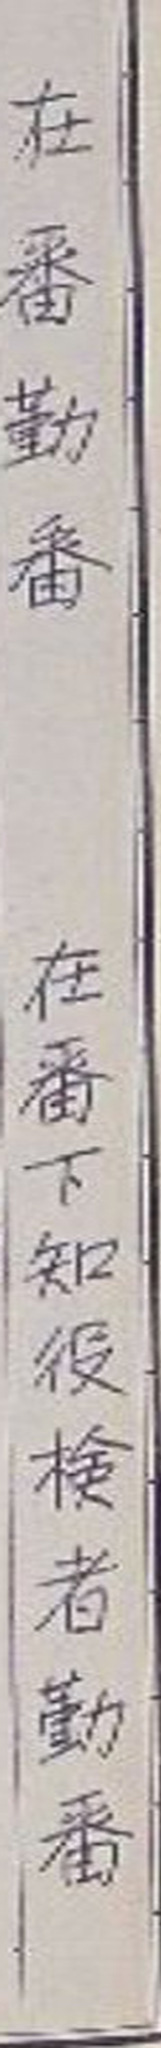在番勤番在番下知役検者勤番
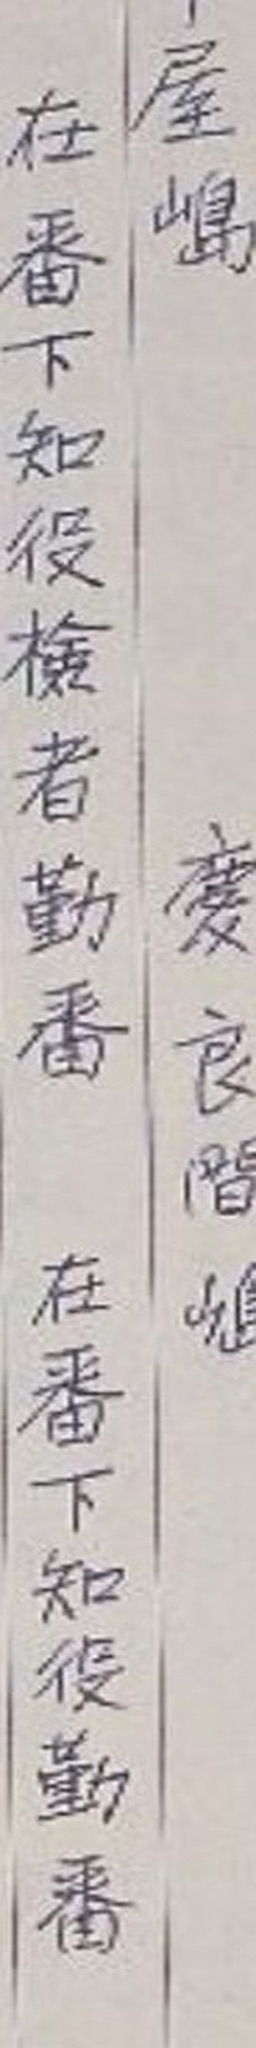在番下知役検者勤番在番下知役勤番
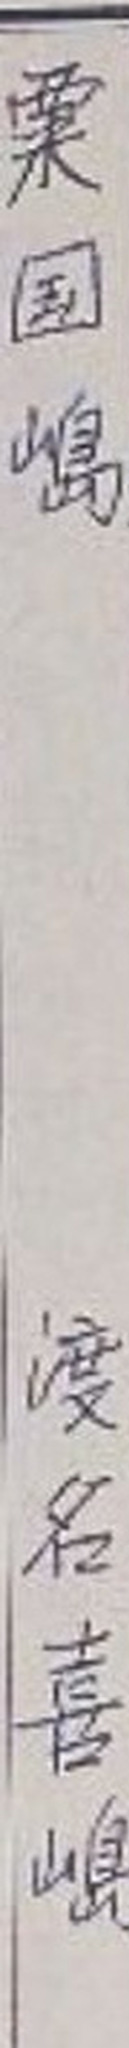粟国島渡名喜島
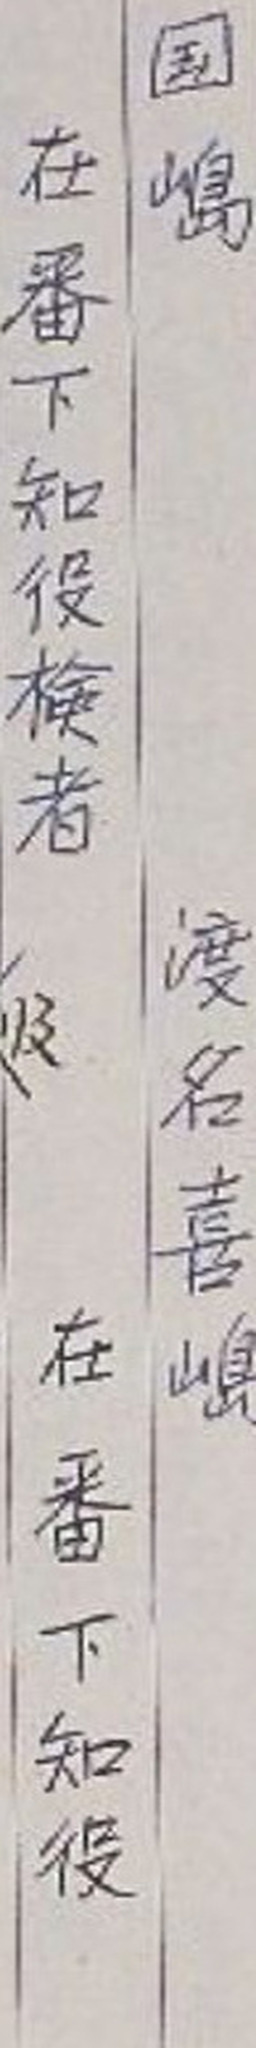在番下知役検者在番下知役
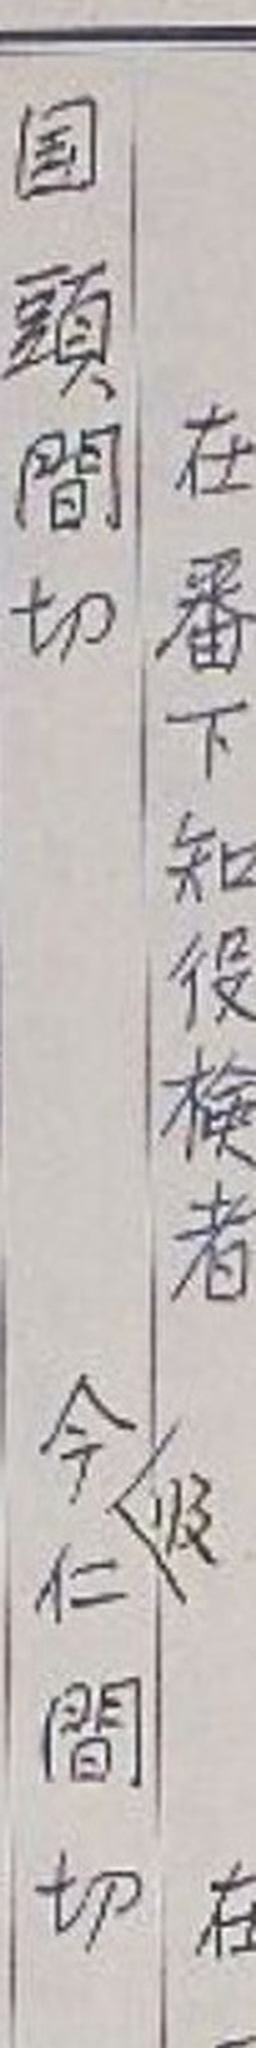国頭間切今帰仁間切
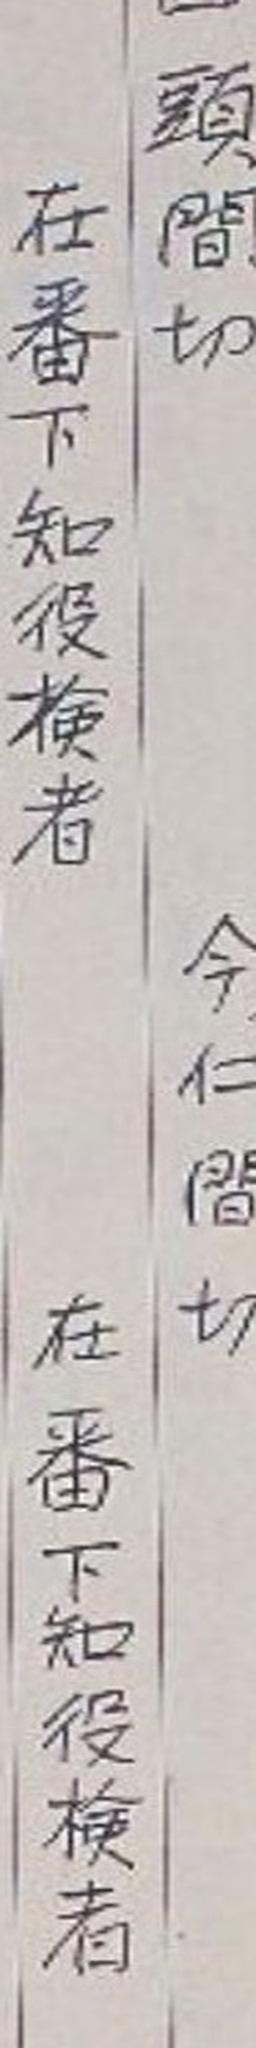在番下知役検者在番下知役検者
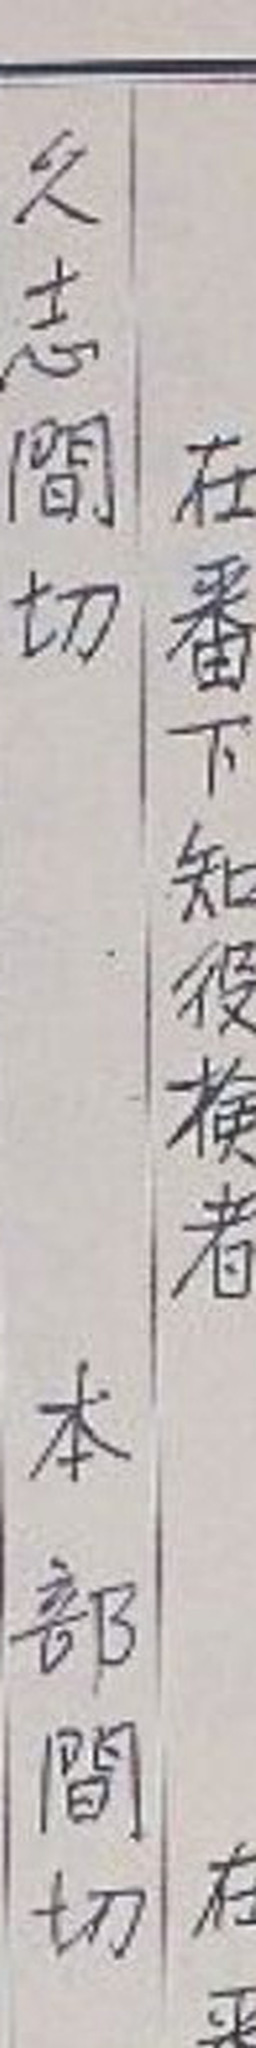久志間切本部間切
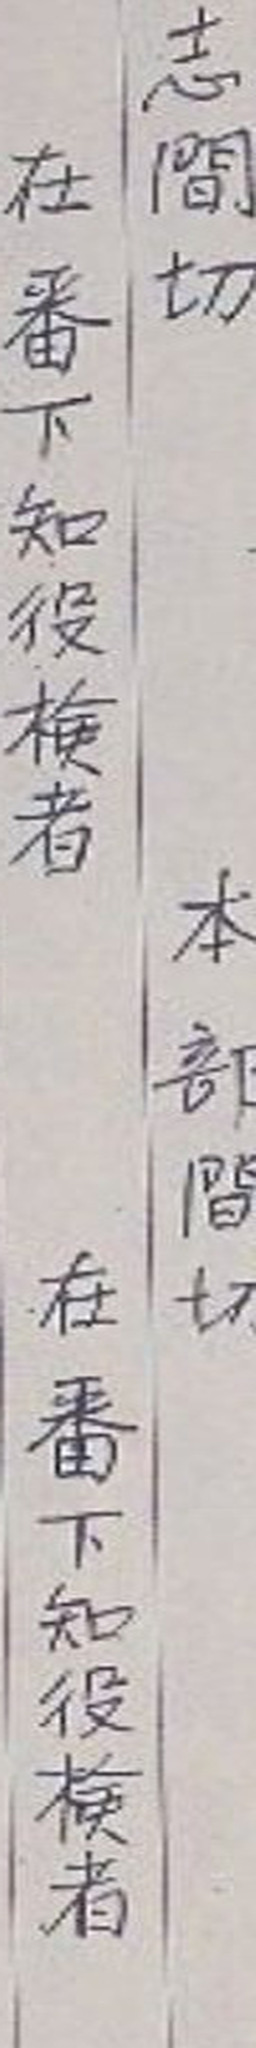在番下知役検者在番下知役検者
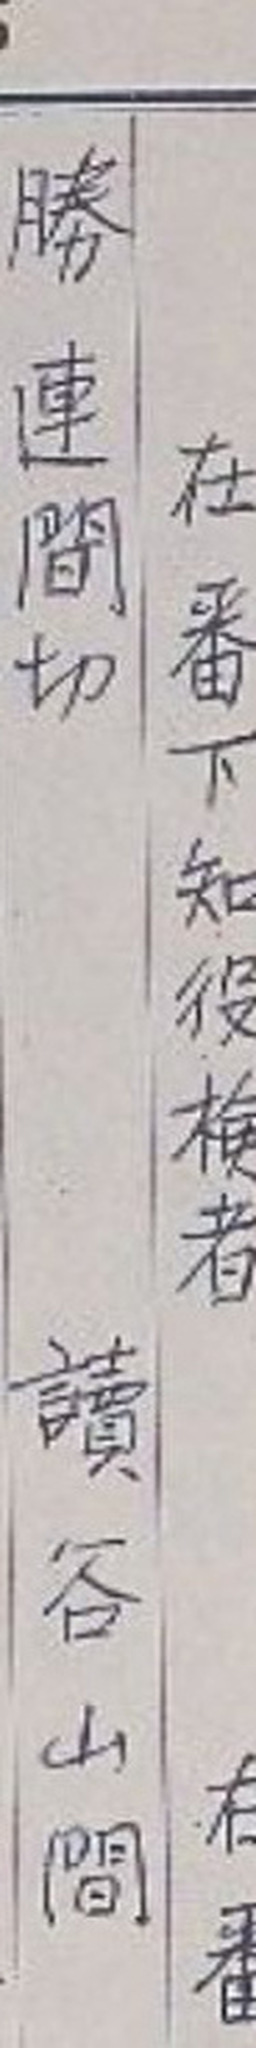勝連間切読谷山間切
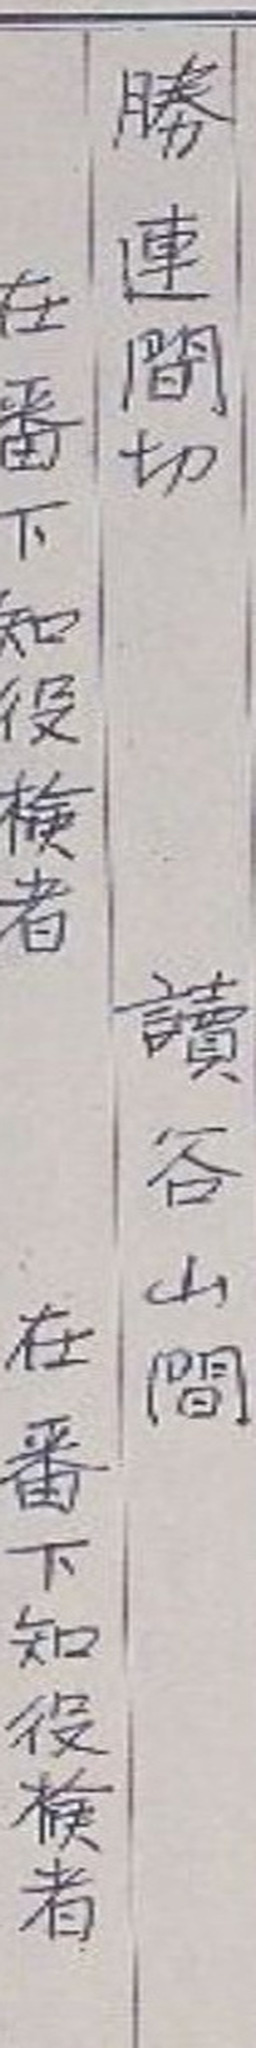在番下知役検者在番下知役検者
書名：支那冊封使来琉諸記 下巻
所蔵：University of the Ryukyus Library
